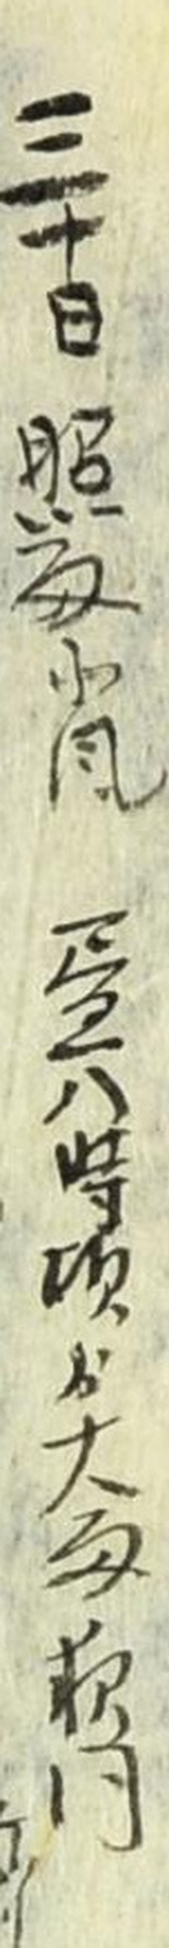三十日照雨北風昼八時頃ゟ大雨夜同
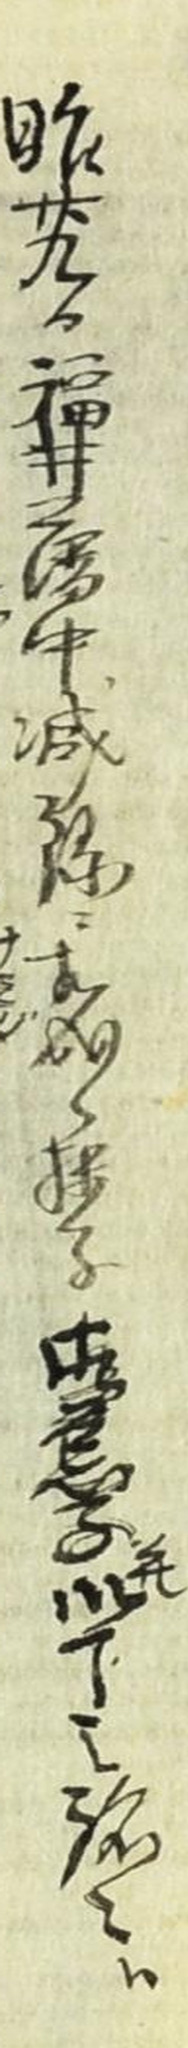昨廿九日福井藩中減録ニ相成候様子御荒子幷以下之銘々ハ
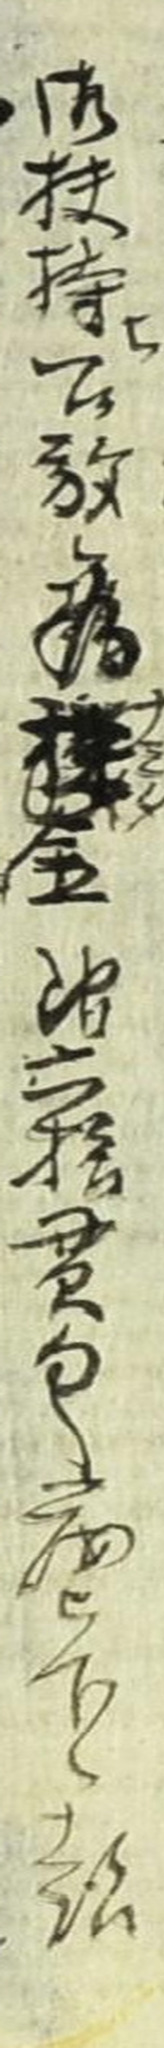御扶持被召放候為金銀六拾貫匁茂被下候趣
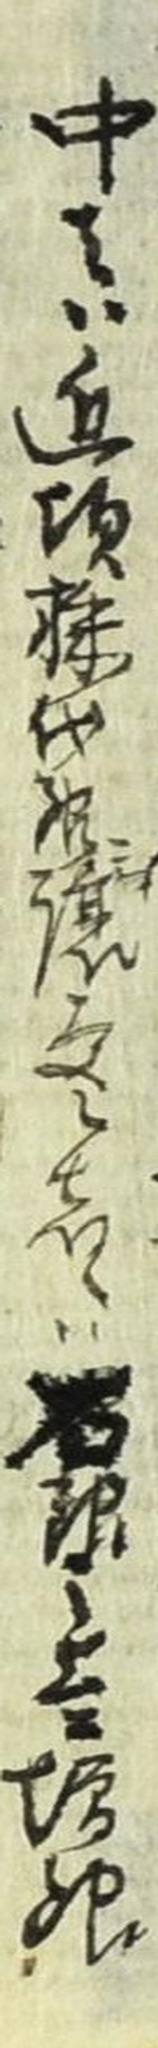中者ハ近頃株代銀ニ而譲受候者へハ右銀之上ニ増銀
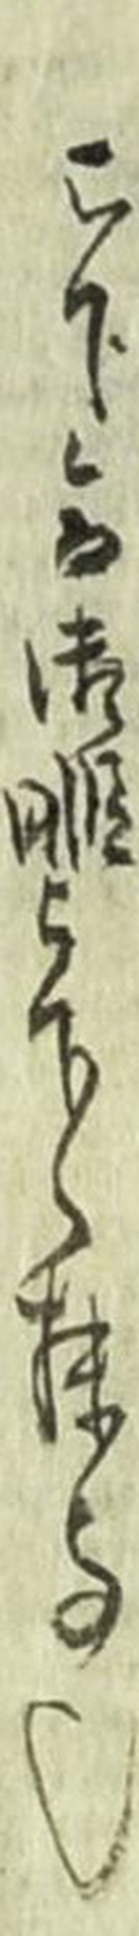被下候而御暇被下候様子也

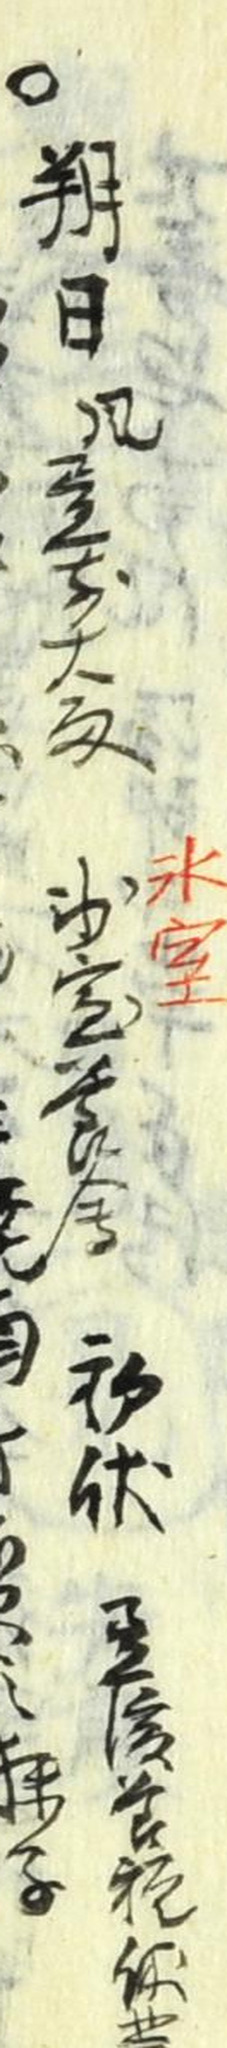○朔日風昼前大雨氷室節会初伏昼後節祝休業
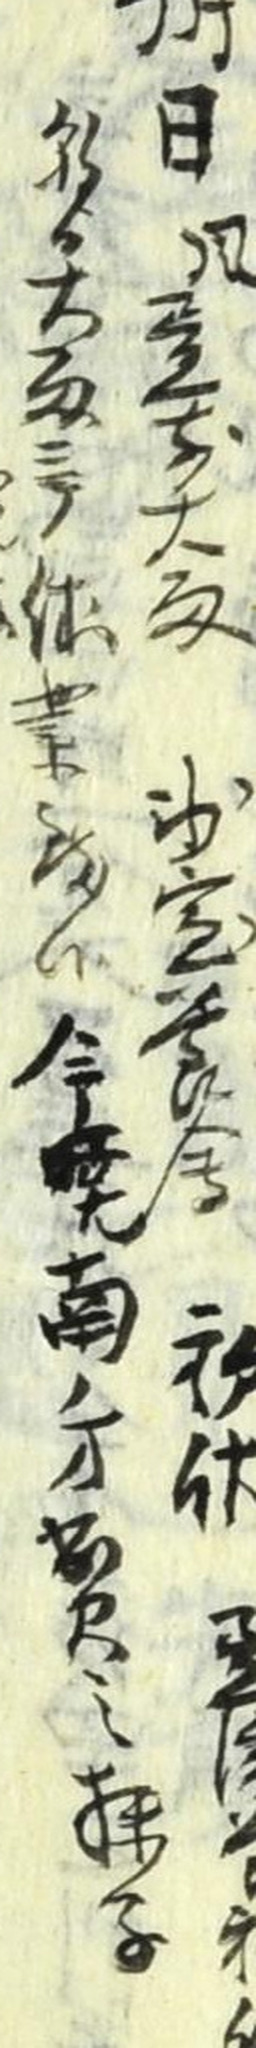朝ゟ大雨ニテ休業致候今暁南ノ方出火之様子
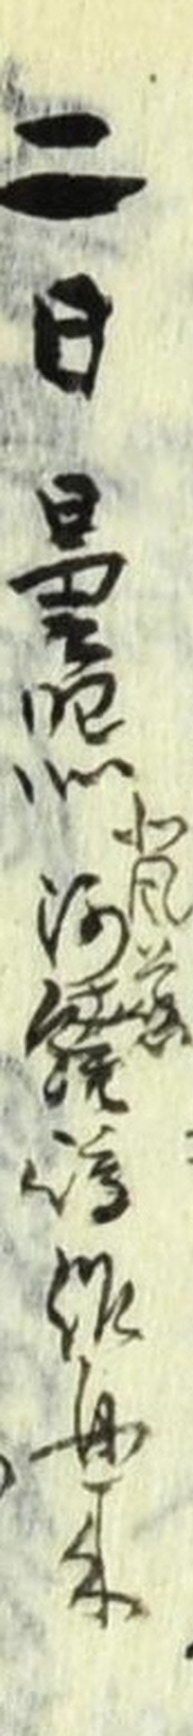二日曇照河饒島作舟来
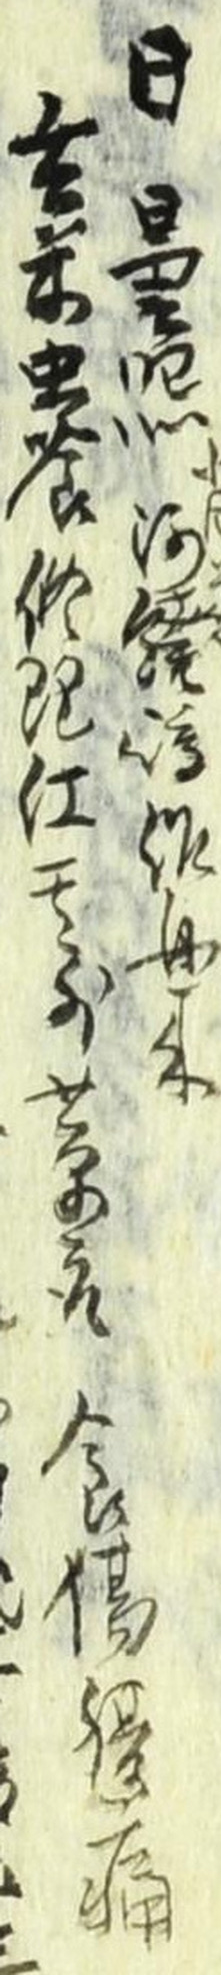玄米虫喰修理仕其外草取食傷腹痛
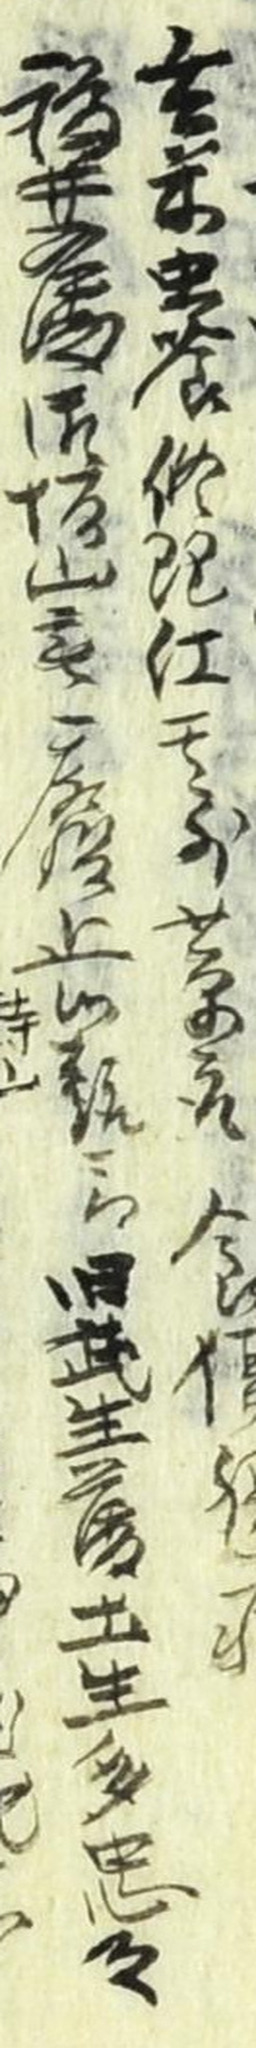福井藩御坂山被廃止候趣に而旧武生藩土生多忠殿
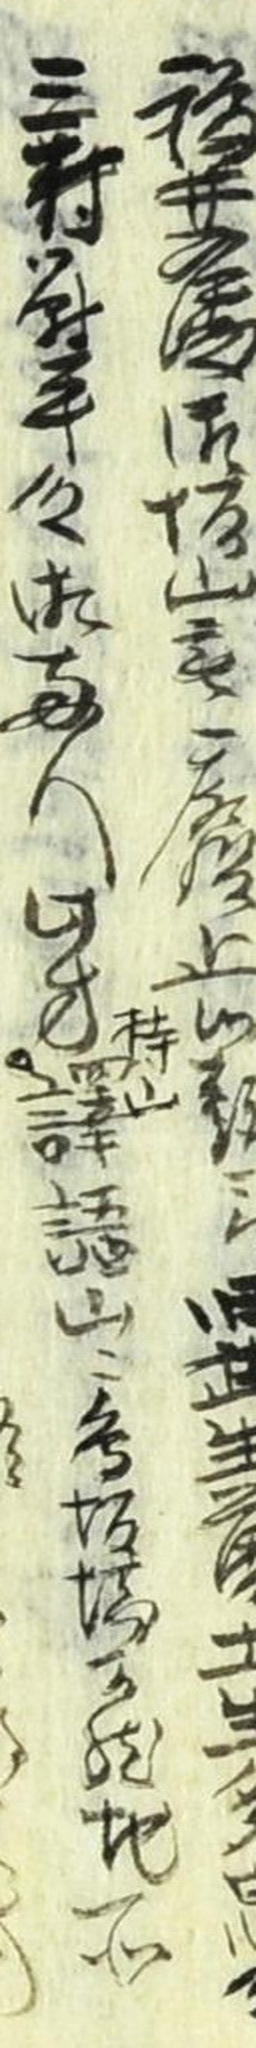三村対平殿御両人此方「持山」訳語山に鳥坂場可然地所
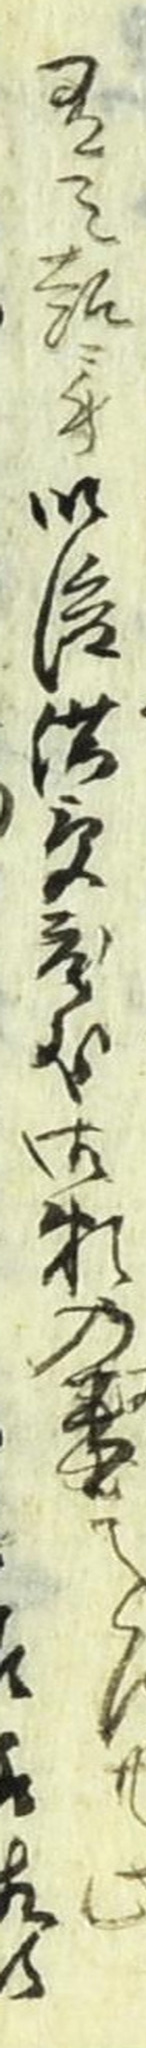有之趣ニ付以後借受度義御頼入有之候得共此
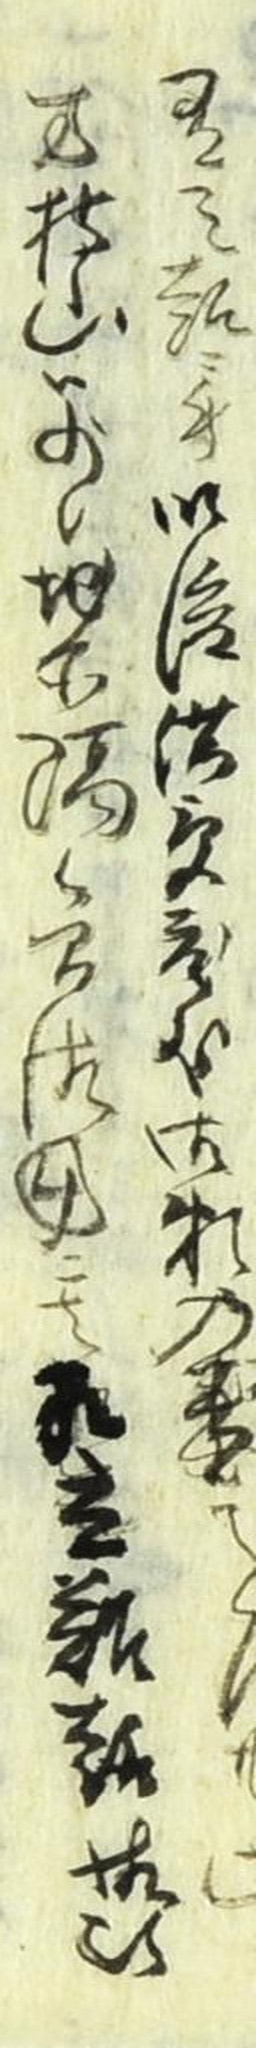方持山ハ少し地所隔候間御用ニ者相立難趣御断
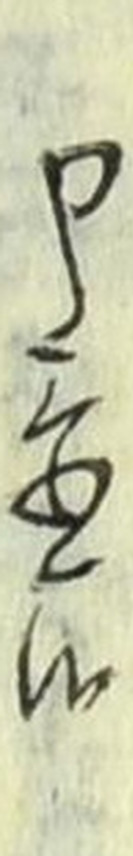申置候
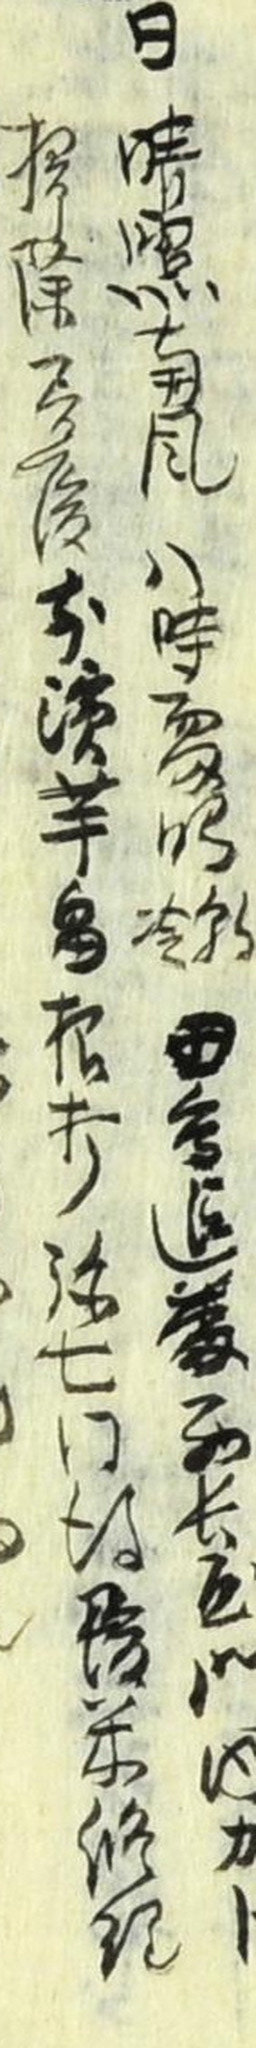掃除昼後前浜芋畠根打弥七同後米修理
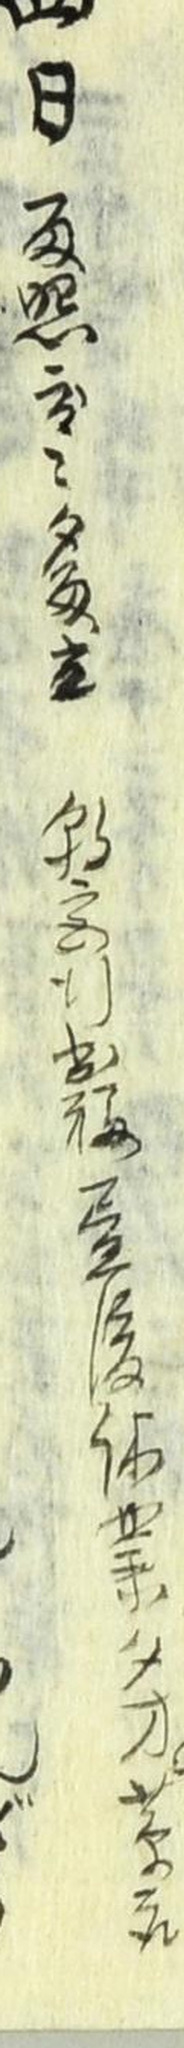四日雨照度々夕雨立朝宮行出福昼後休業夕方「門内」草取
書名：（日記）
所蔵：福井県文書館 Fukui Prefectural Archives
